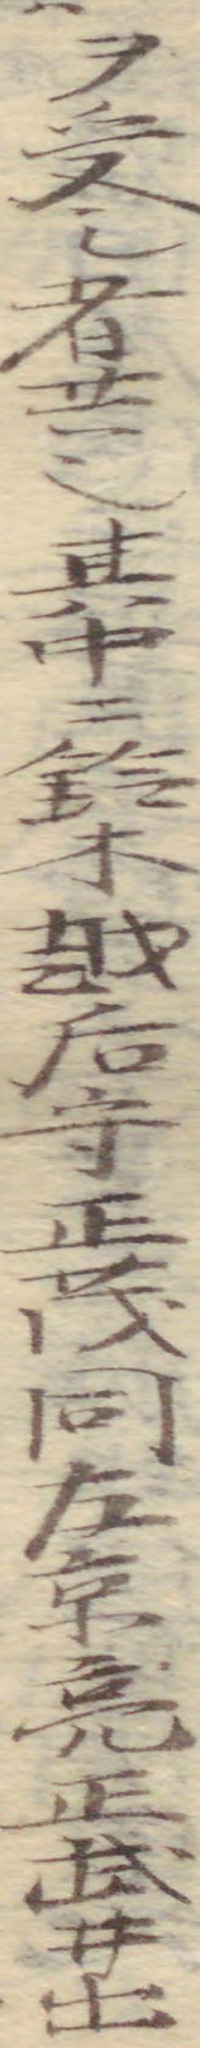ヲ受シ者共也其中ニ鈴木越後后守正茂同左京亮正武井出
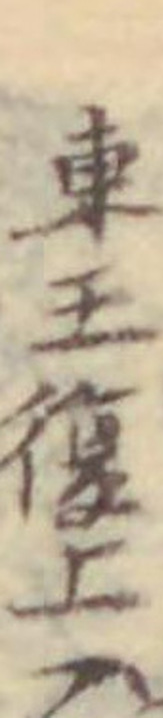東王復上
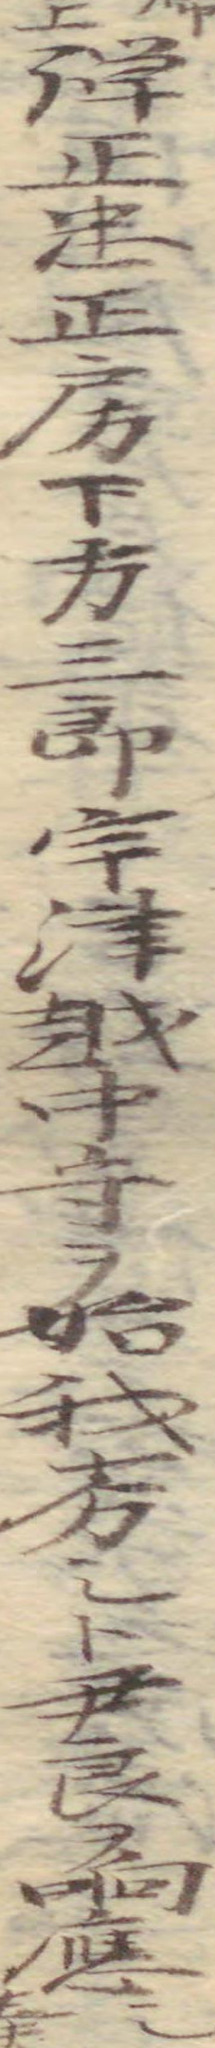弾正忠正房下方三郎宇津越中守ヲ始我劣シト尹良ヲ响応シ奉ル
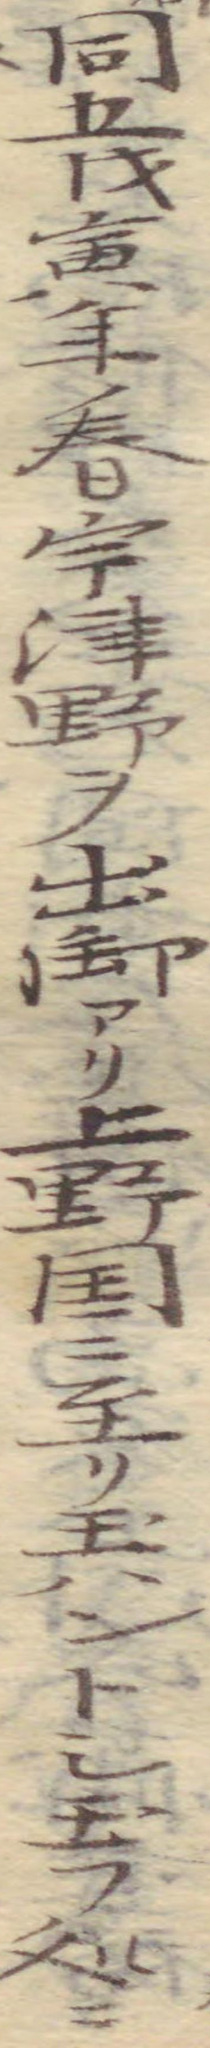同五戌寅年ノ春宇津野ヲ出御アリ上野国ニ至リ玉ハントシ玉フ処ニ
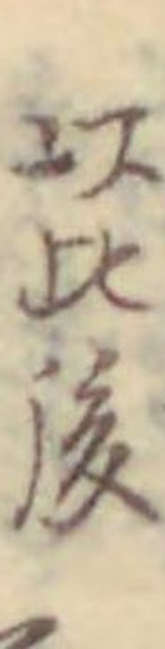以此後
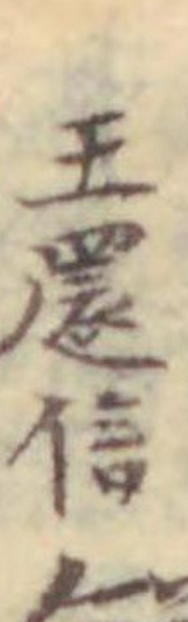王還信
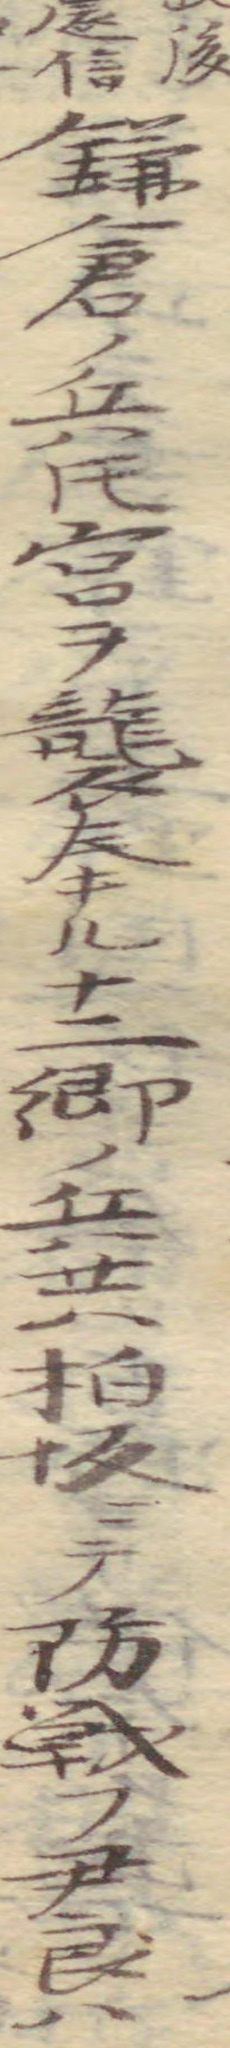鎌倉ノ兵トモ宮ヲ襲奉ル十二郷ノ兵共柏坂ニテ防戦フ尹良ハ
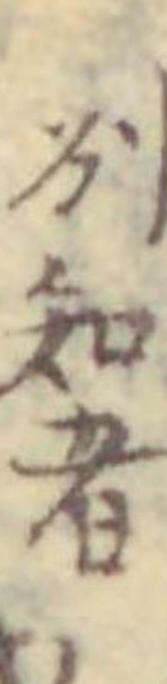州知者
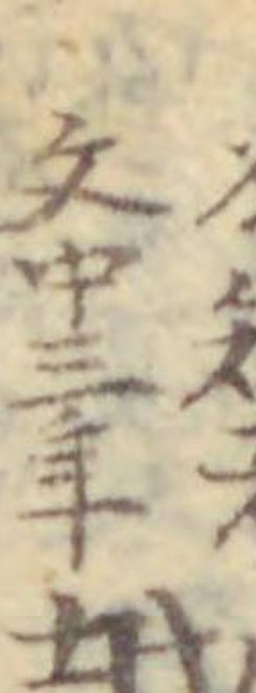文中三年
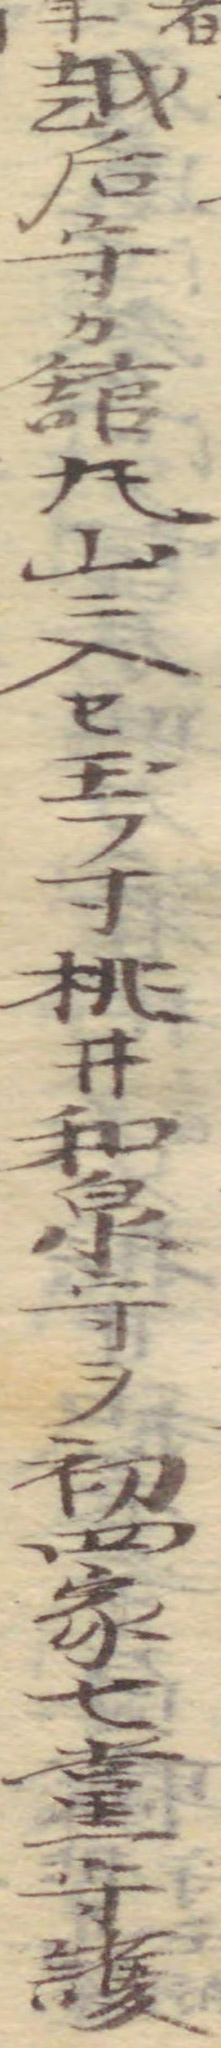越后守カ館丸山ニ入セ玉フ寸桃井和泉守ヲ四家七党守護
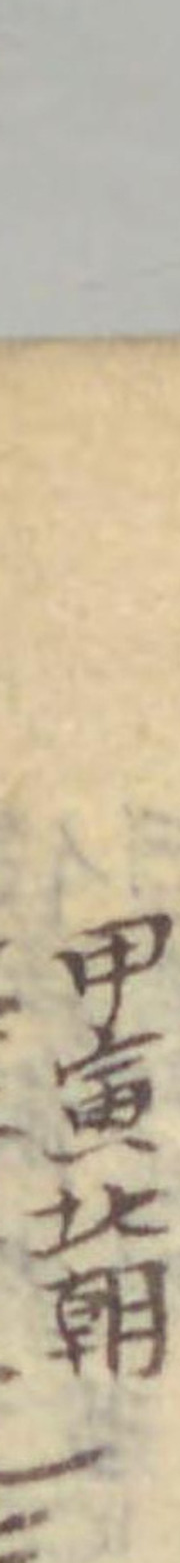甲寅北朝
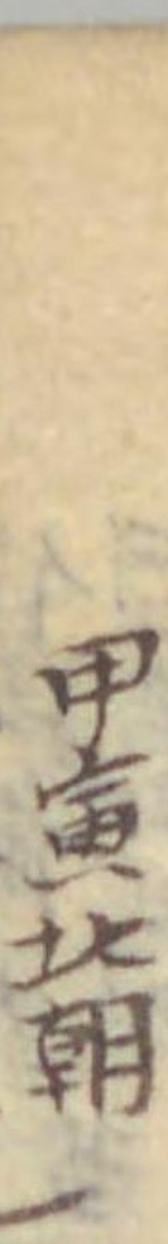甲寅北朝
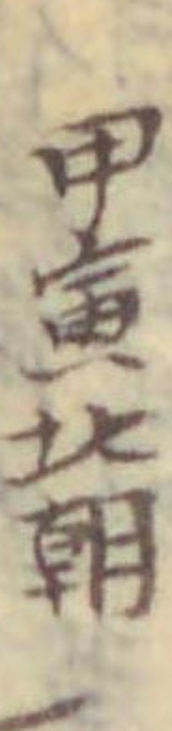甲寅北朝
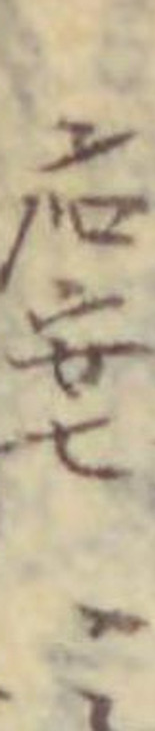応安七
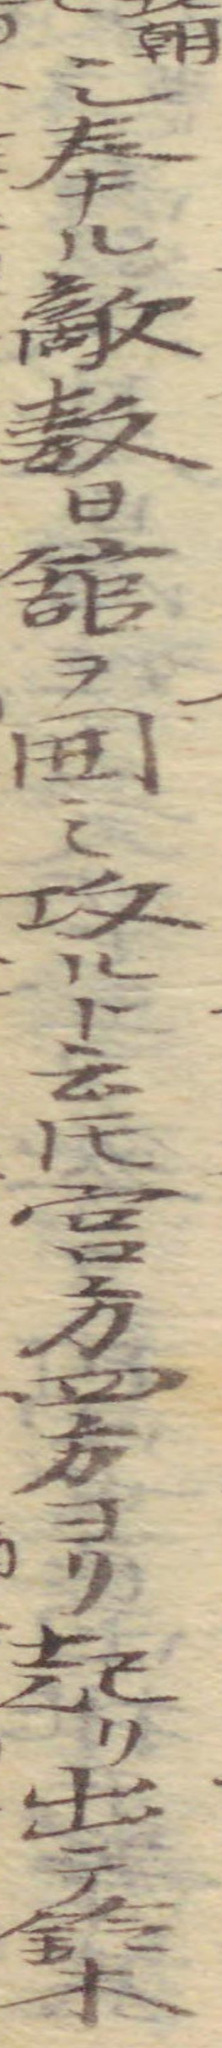シ奉ル敵数日館ヲ囲ミ攻ルト云トモ宮方四方ヨリ起リ出テ鈴木
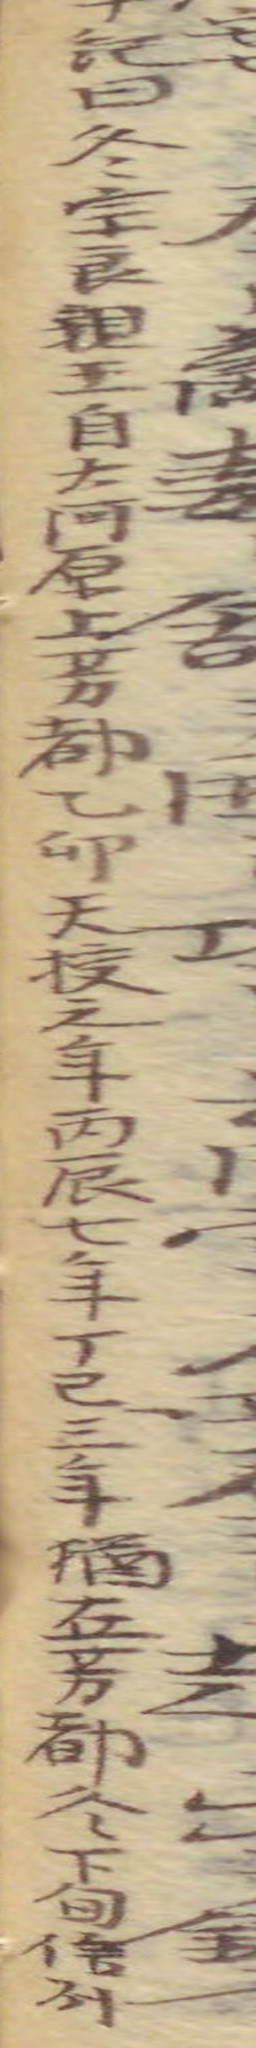年記曰冬宗良親王自大河原上芳都乙卯天授元年丙辰七年丁巳三年猶在芳都冬下旬信州
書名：鶯宿雑記. 巻199-200
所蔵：国立国会図書館 National Diet Library, JAPAN
